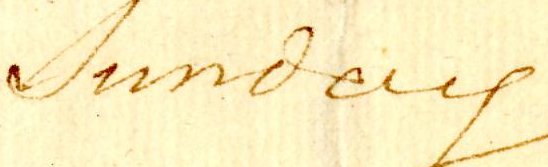Sunday
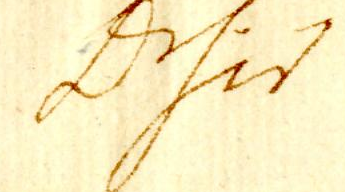D^r Sir
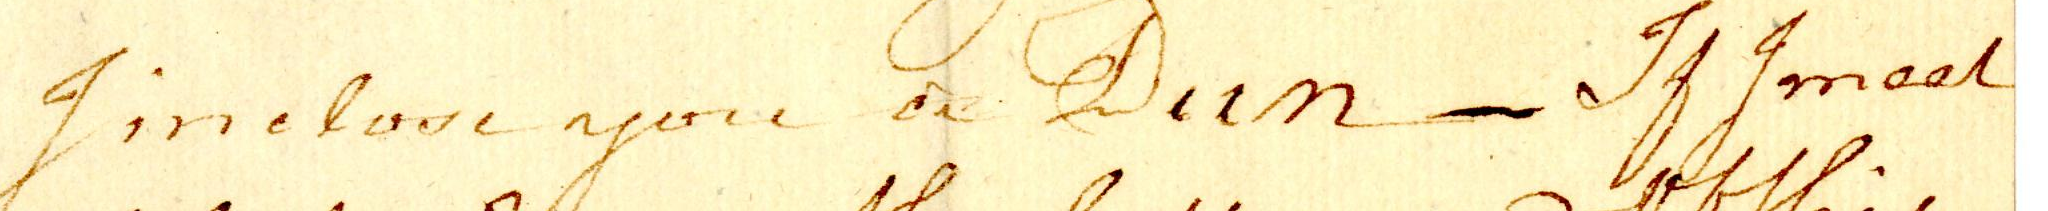I inclose you a Dun.- If I meet
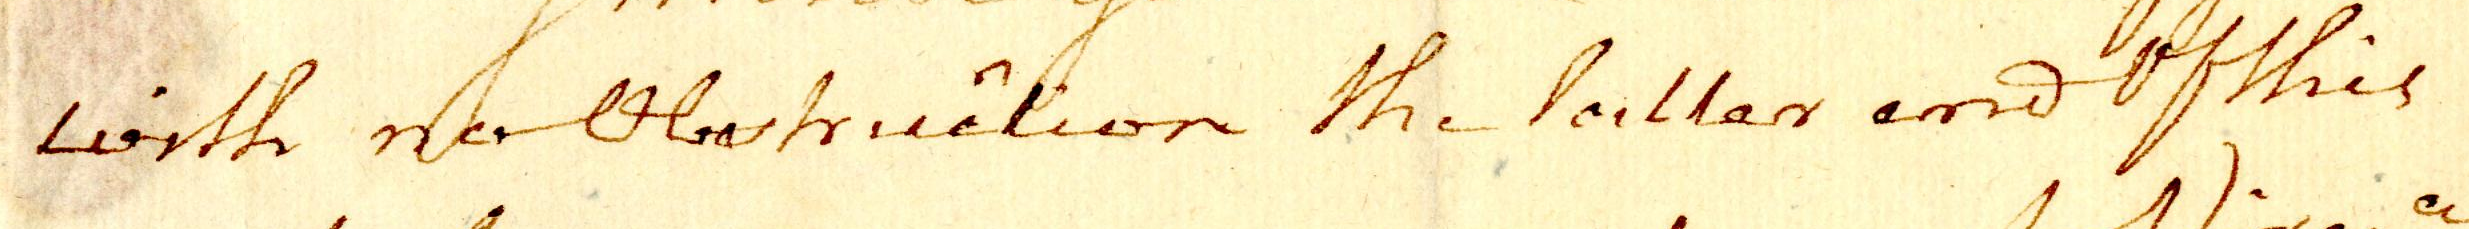with no Obstruction the Paller end of this
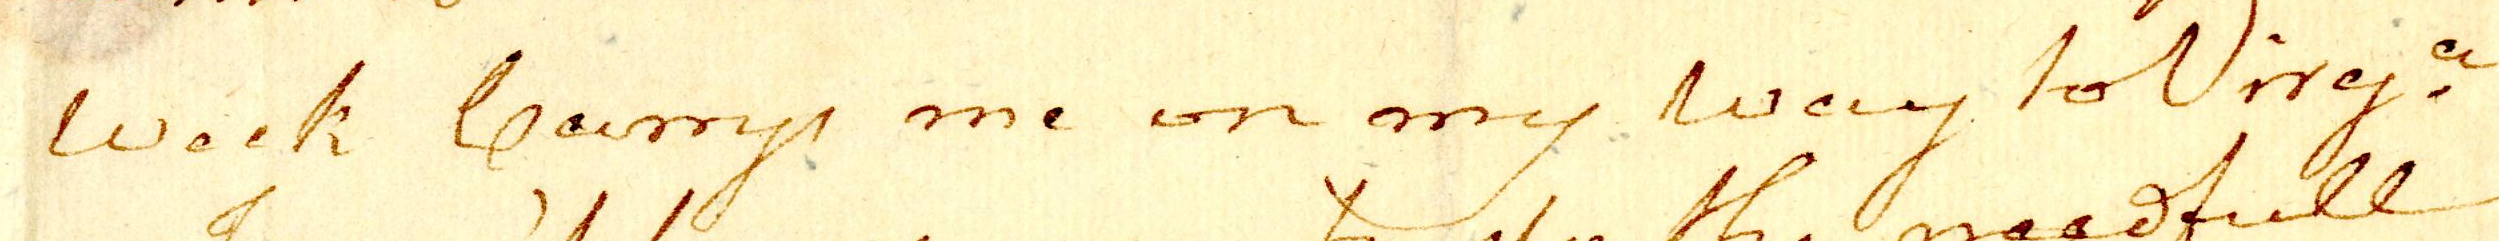week Carrys me on my way to Virg^a
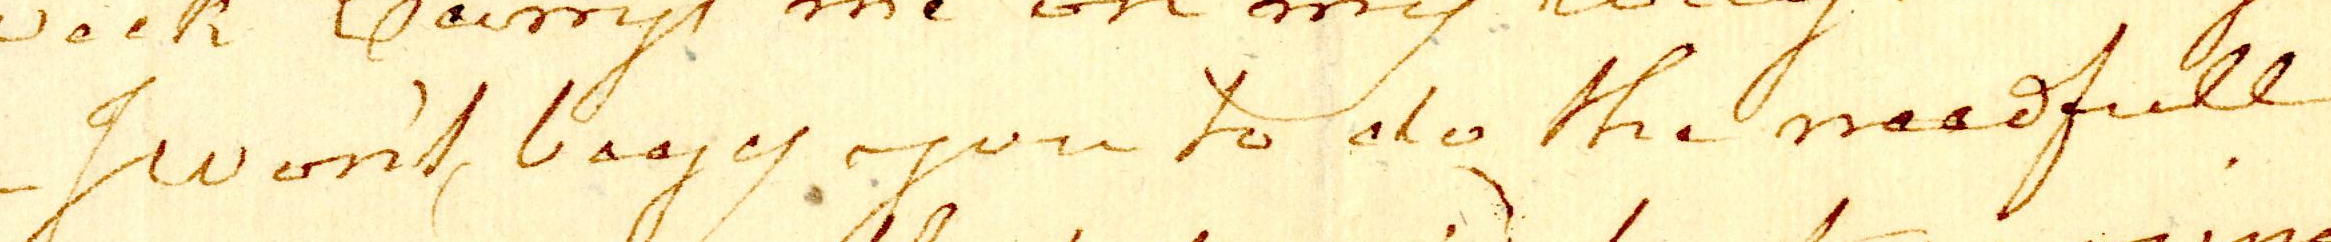I won't begg you to do the needfull
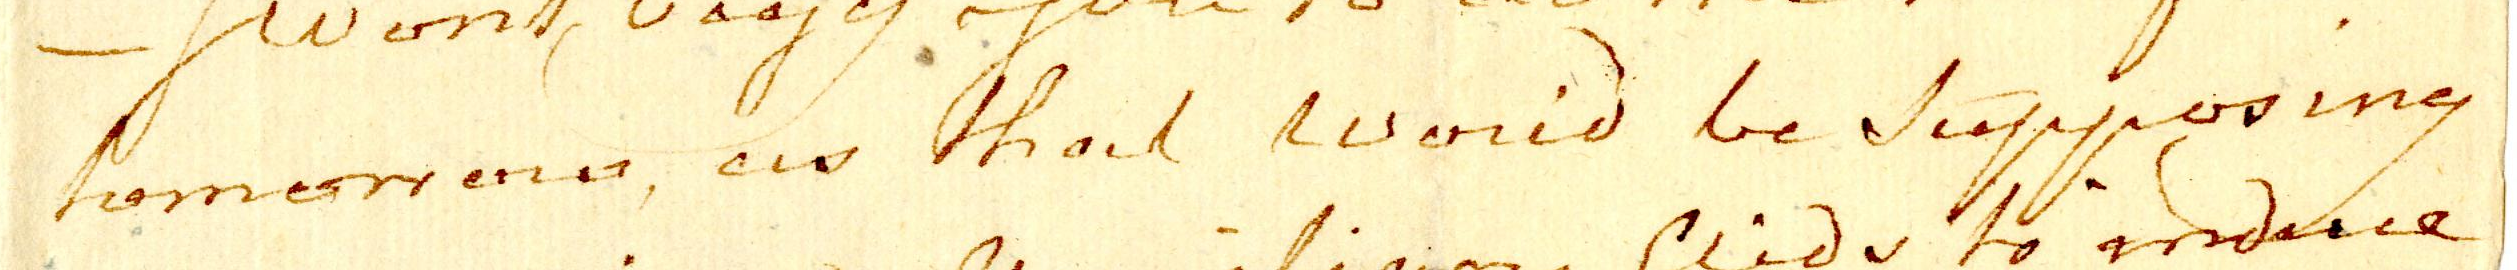tomorrow, as that wou'd be supposing
